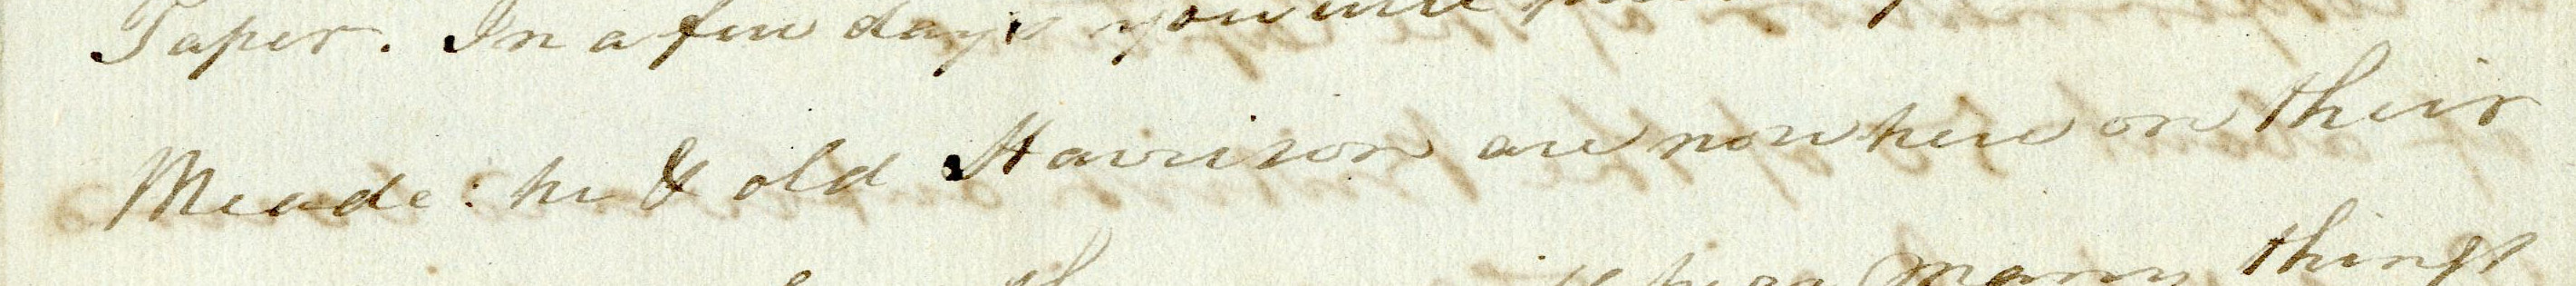Meade: he & old Harrison are now here on their
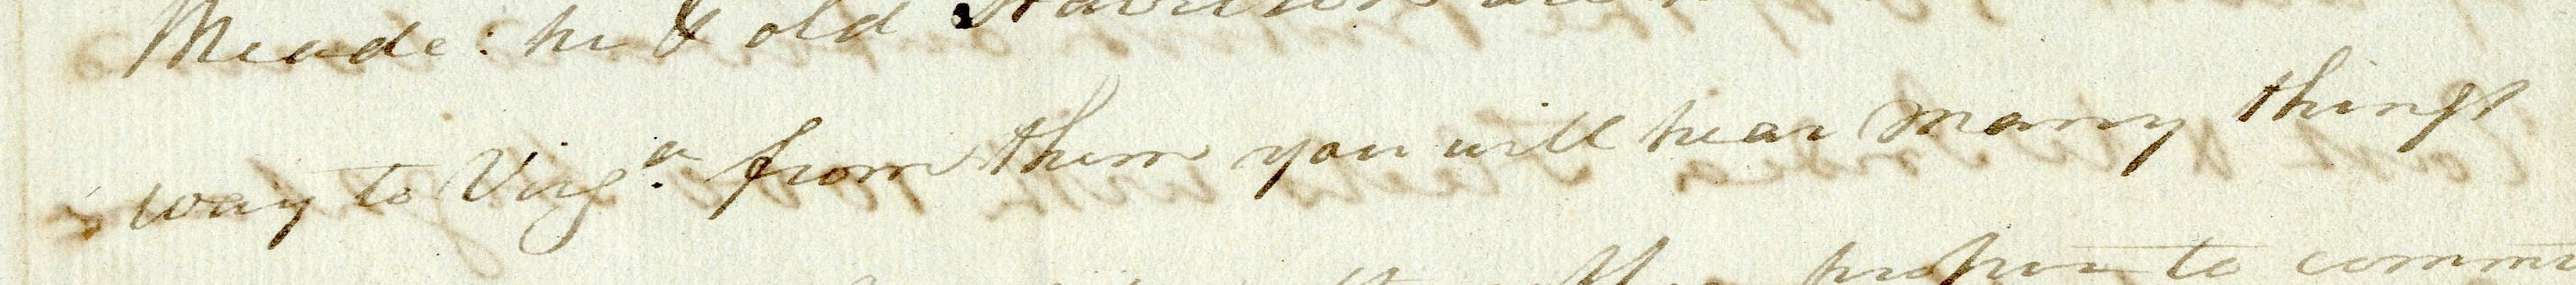way to Virg^a. from them you will hear many things
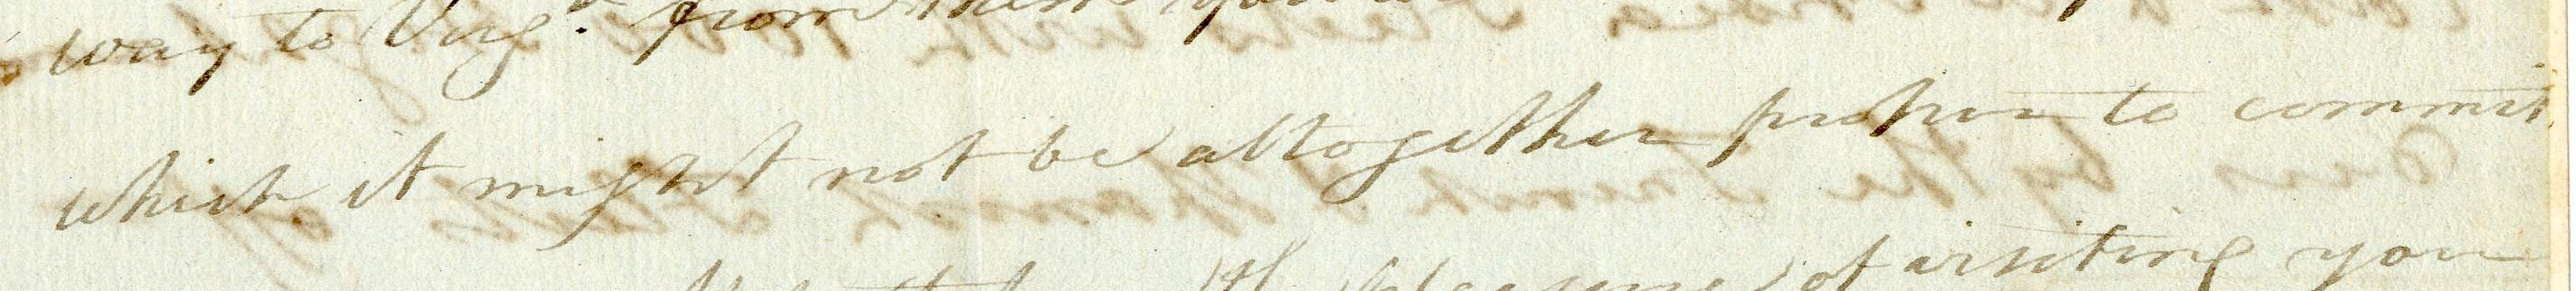which it might not be altogether proper to commit
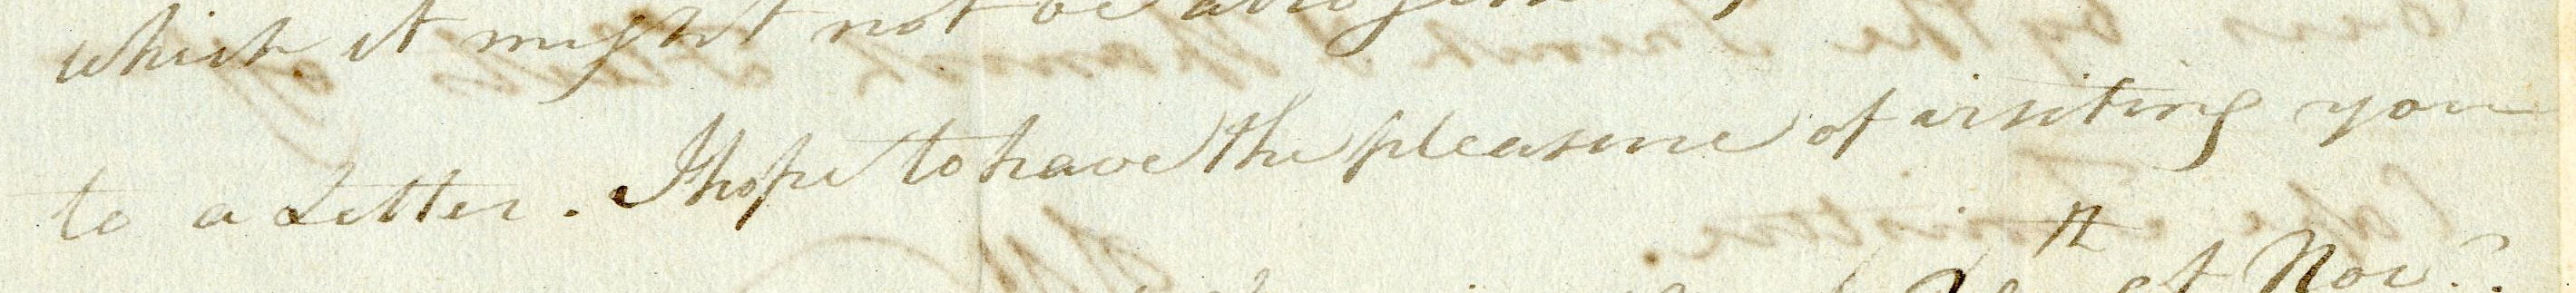to a Letter. I hope to have the pleasure of writing you
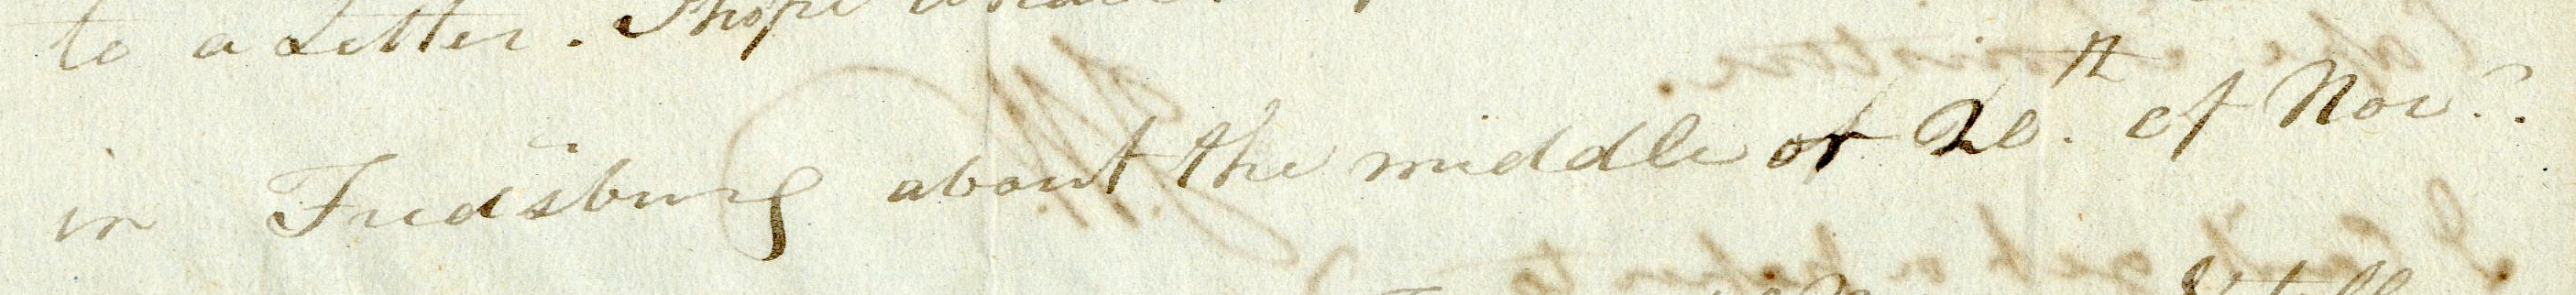in Fredsburg about the middle of the 20^th. of Nov.
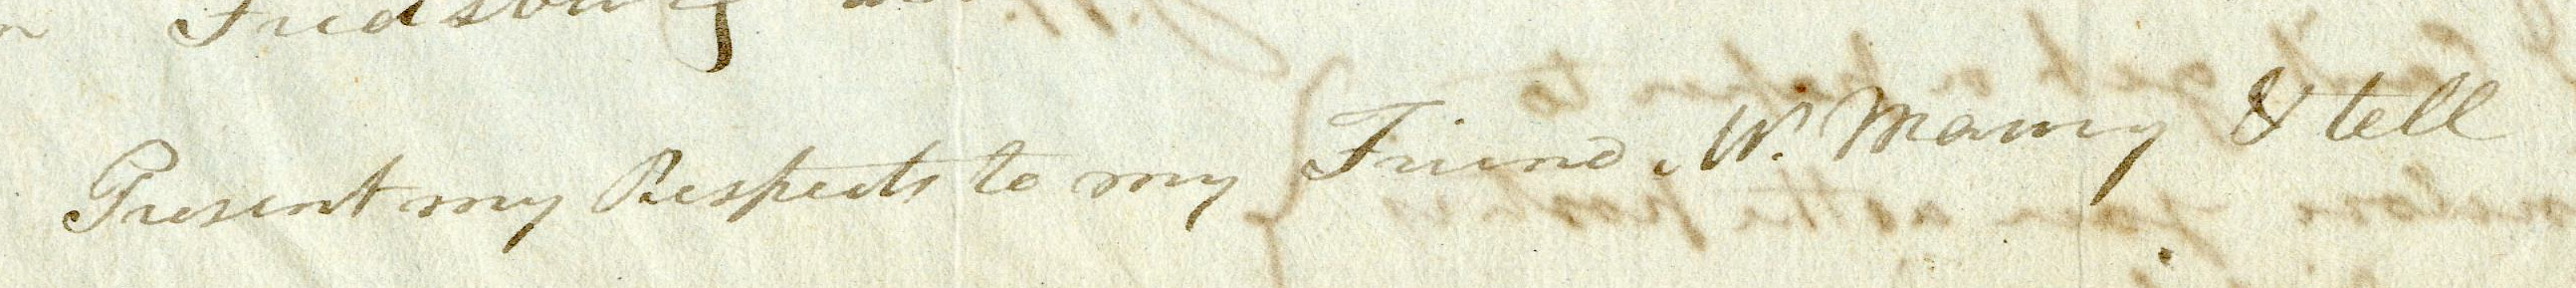Present my Respects to my Friend M^r. Maury & tell
